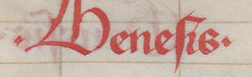.Geneſis.
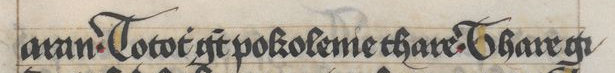aran.Totoť ḡt pokolenie thare.Thare gi¬
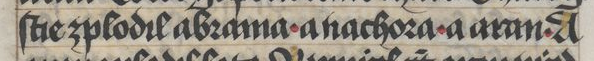ſtie zplodil abrama.a nachora.a aran.A
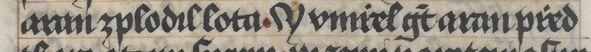aran zplodil lota.Y ymṙel ḡt aran pṙed
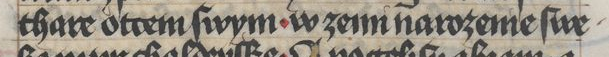thare otcem ſwym.w zemi narozeníe ſwe
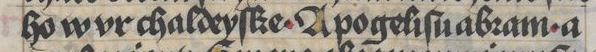ho w vr chaldeyſke.A pogeliſu abram.a
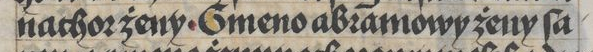nachor żeny.Gmeno abramowy żeny ſa¬
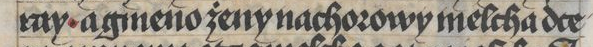ray.a gmeno żeny nachorowy melcha dce¬
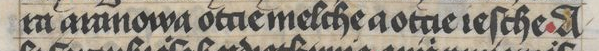ra aranowa otcie melche a otcie ieſche.A¬
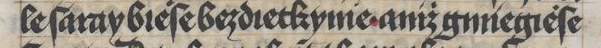le ſaray bíeẛe bezdietkynie.aniż gmegieẛe
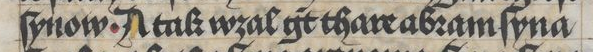ſynow.A tak wzal ḡt thare abrani ſyna¬
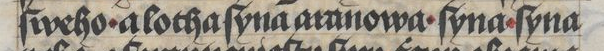ſweho.a lotha ſyna aranowa.ſyna.ſyna
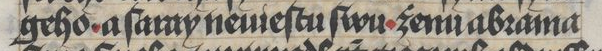geho.a ſaray neuieſtu ſwu.żenu abrama
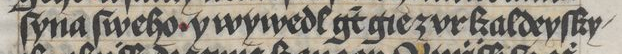ſyna ſweho.y wywedl ḡt gie z vr kaldeyſky¬
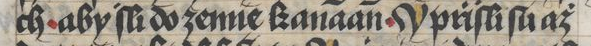ch.aby ẛli do zemíe kanaan.Y pṙiẛli ſu aż
